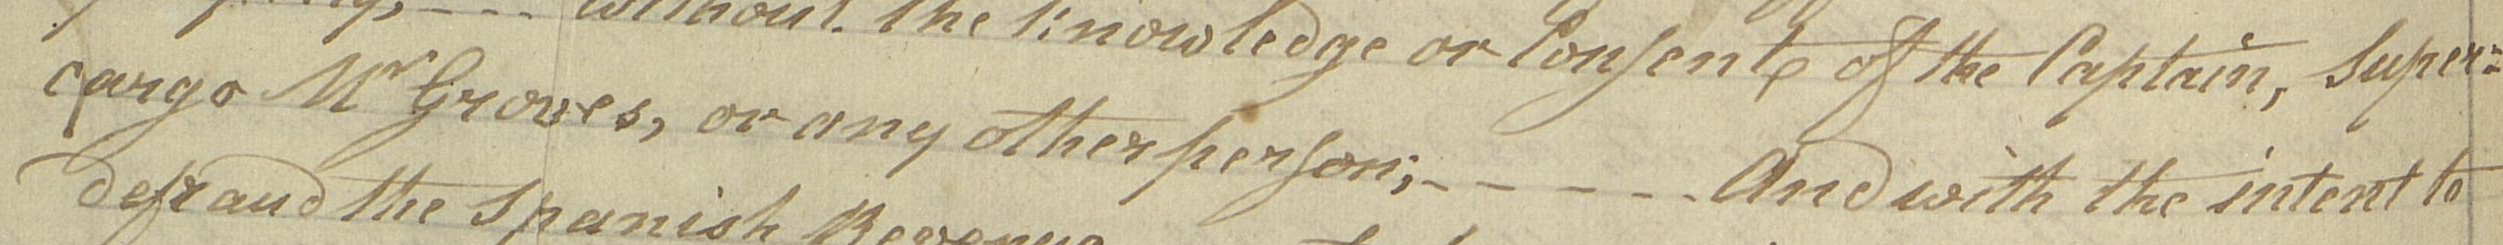Cargo M^r Groves, or my other person; And with the intent to
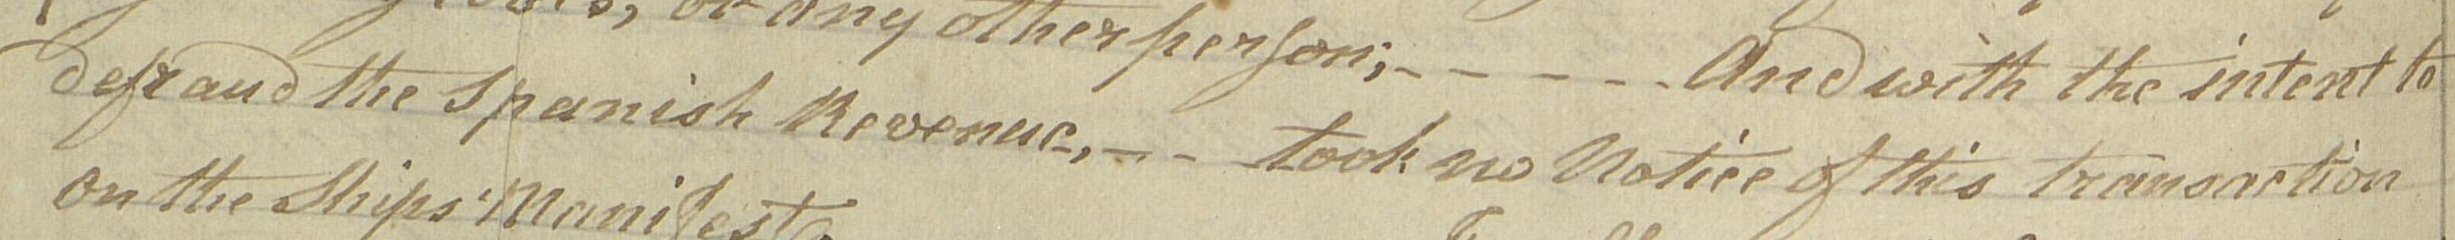defraud the spanish Revenue, took no Notice of this transaction
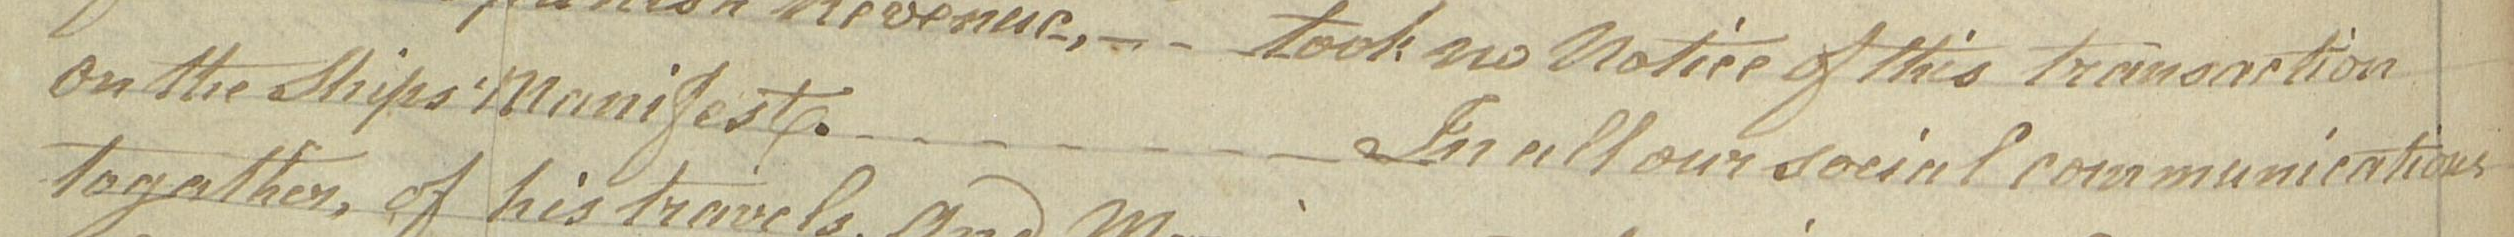on the Ships Manifest. In all our social communications
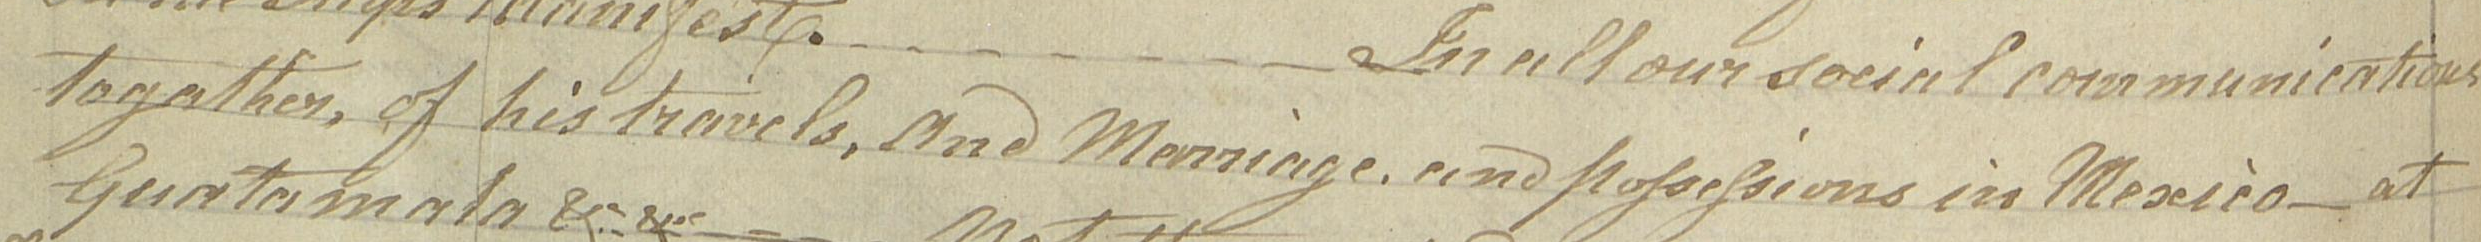togather, of his travels, and Marriage, and possessions in Mexico at
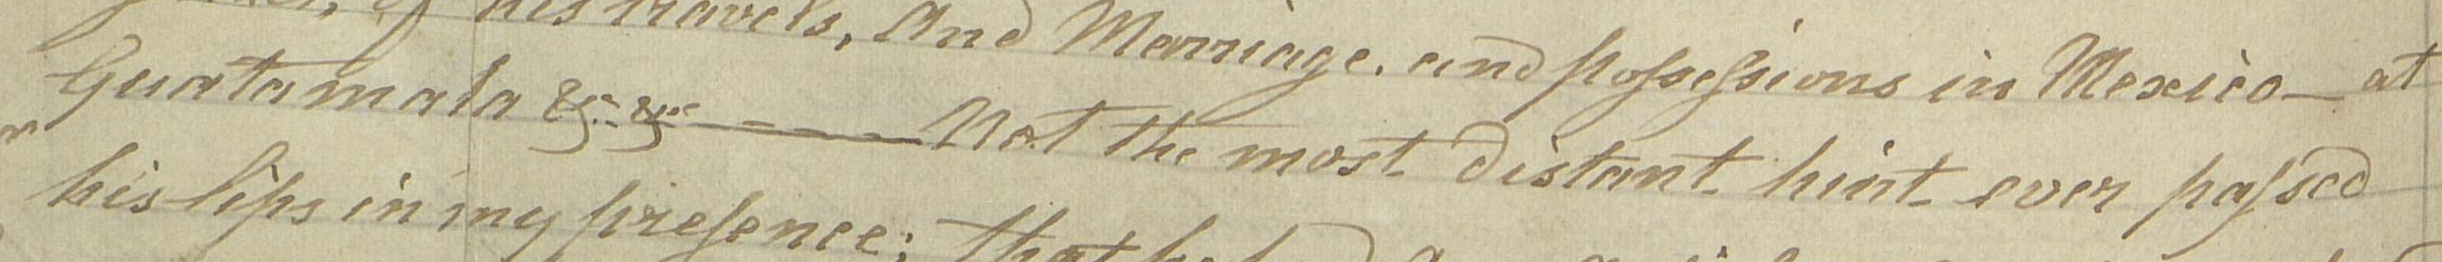Guatamaa &^c &^c Not the most distant hint ever passed
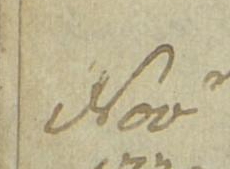Nov^r
